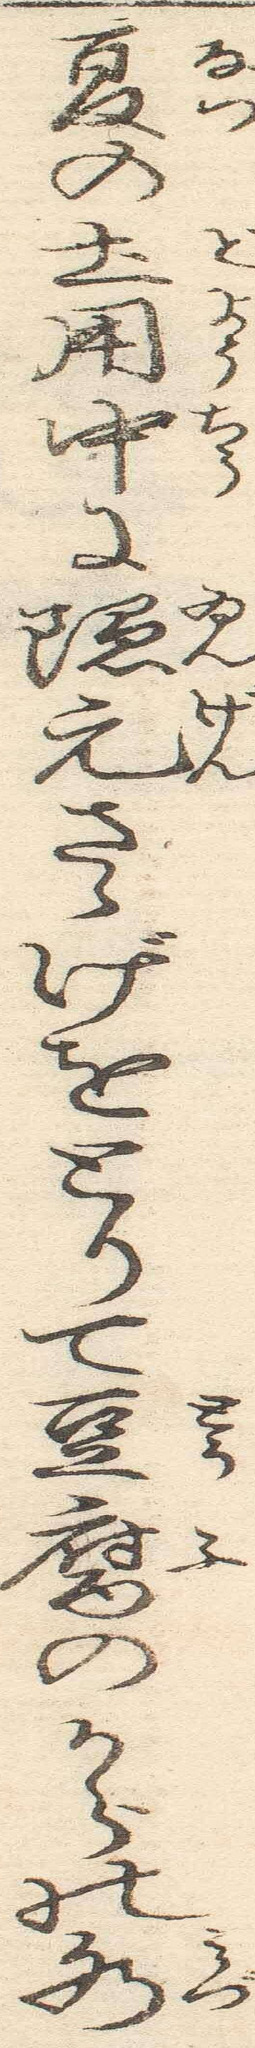夏の土用中に隠元さゝげをとりて豆腐のからの水
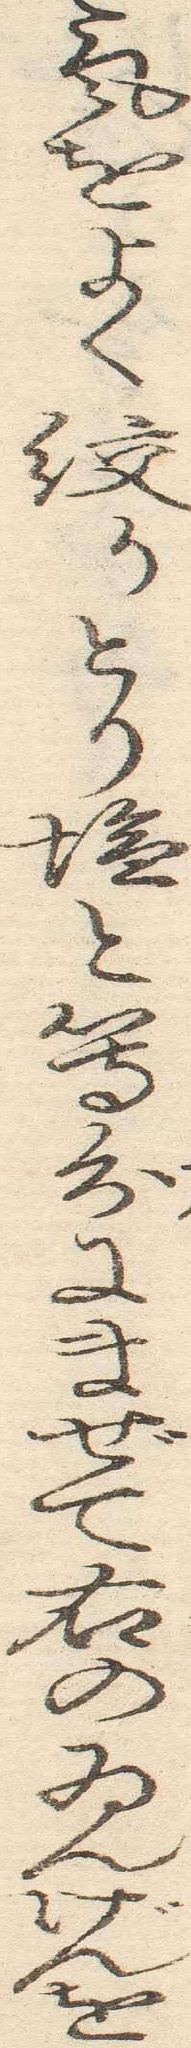気をよく絞りとり塩と等分にまぜて右のゐんげんを
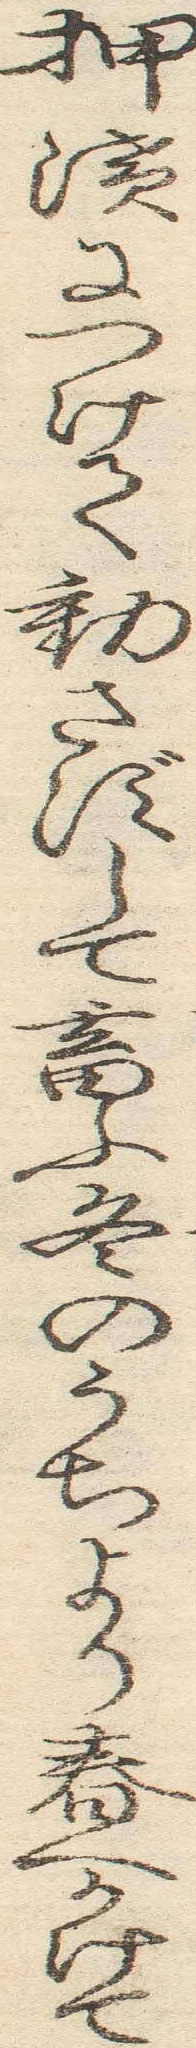押漬につけて動さずして蓄ふ冬のうちより春へかけて

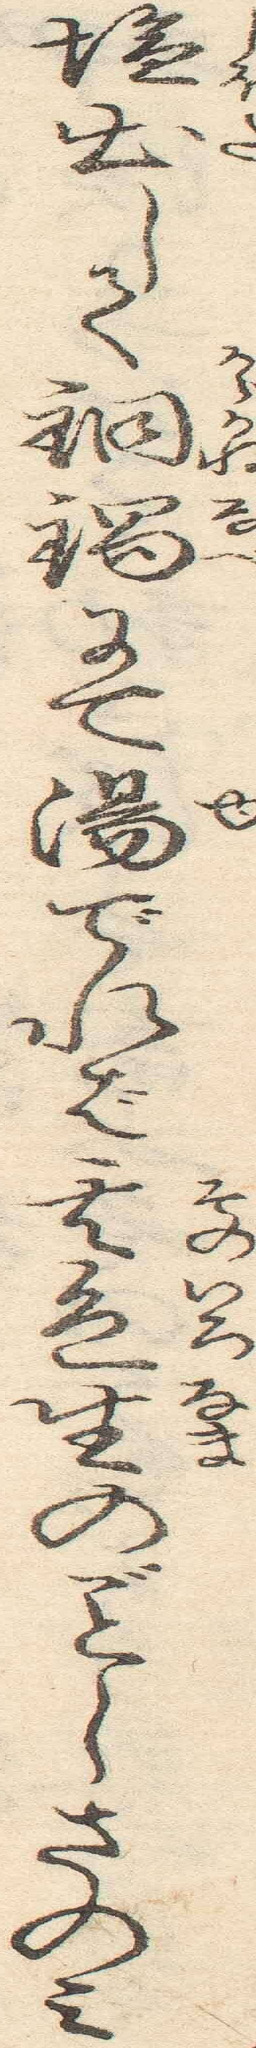塩出して銅鍋にて湯でれば其色生のことさのみ
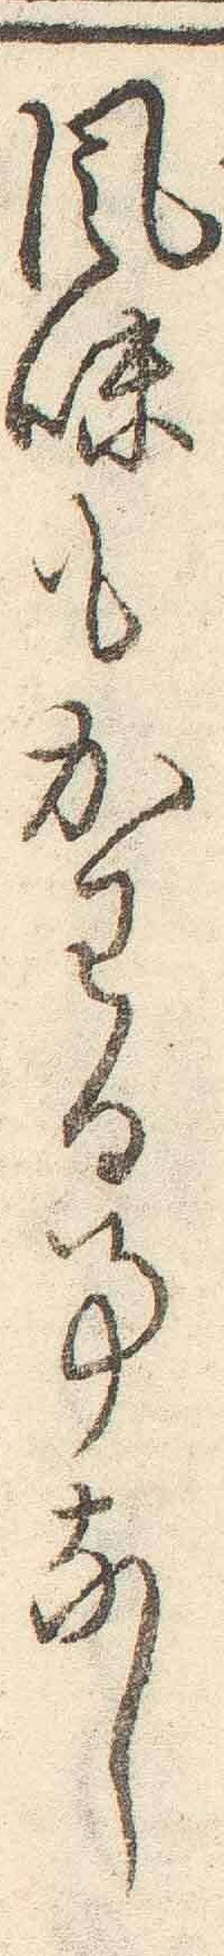風味もかわる事なし
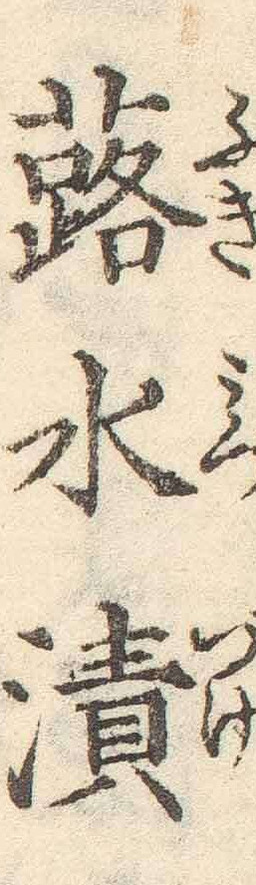蕗水漬
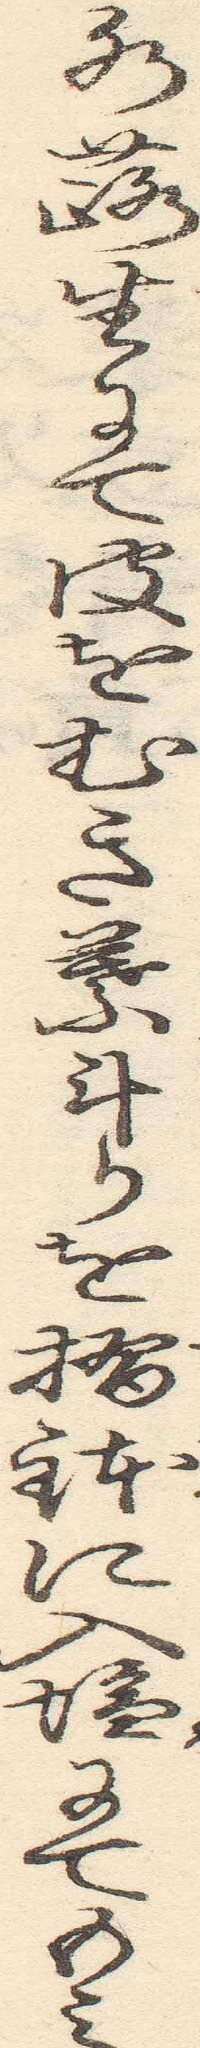水蕗生にて皮をむき葉斗りを擂鉢に入塩にてもみ
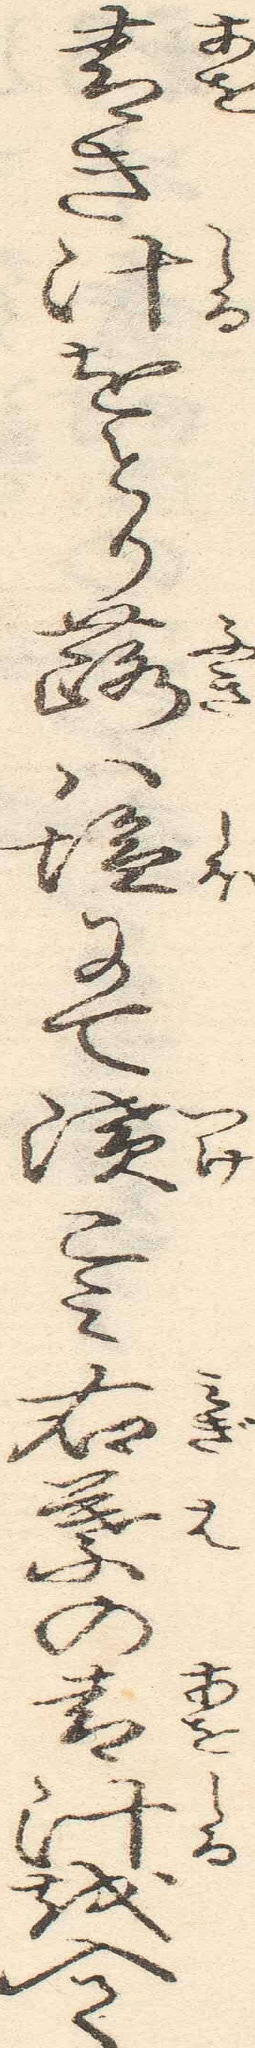青き汁をとり蕗は塩にて漬こみ右葉の青汁を入て
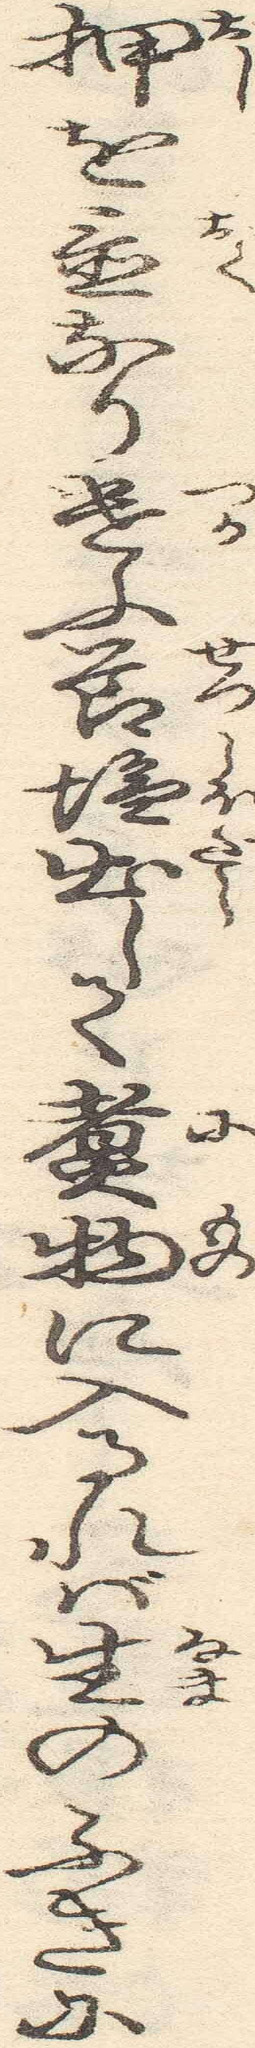押を置なり遣ふ節塩出して煮物に入るれば生のふきに
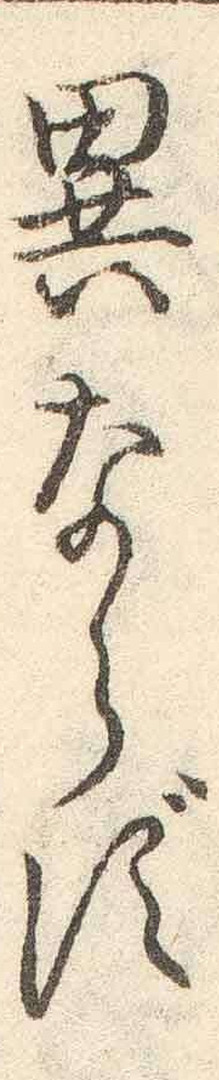異ならず
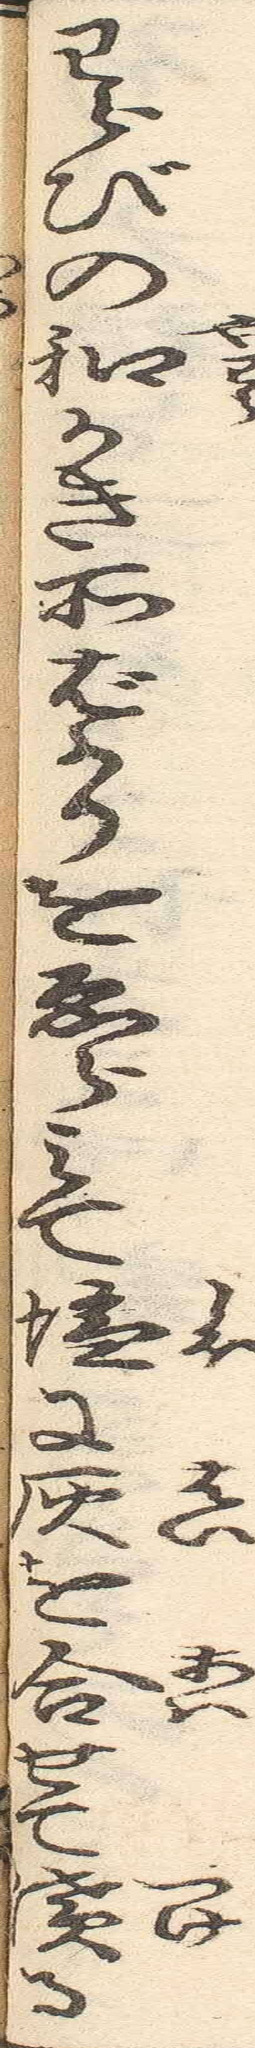わらびの和かき所ばかりをゑらみて塩に灰を合せて漬る
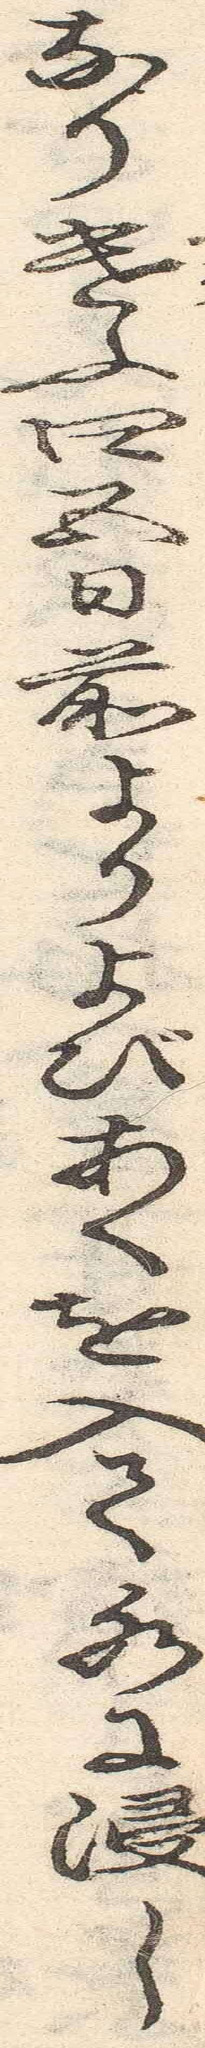なり遣ふ四五日前よりよびあくを入て水に浸し
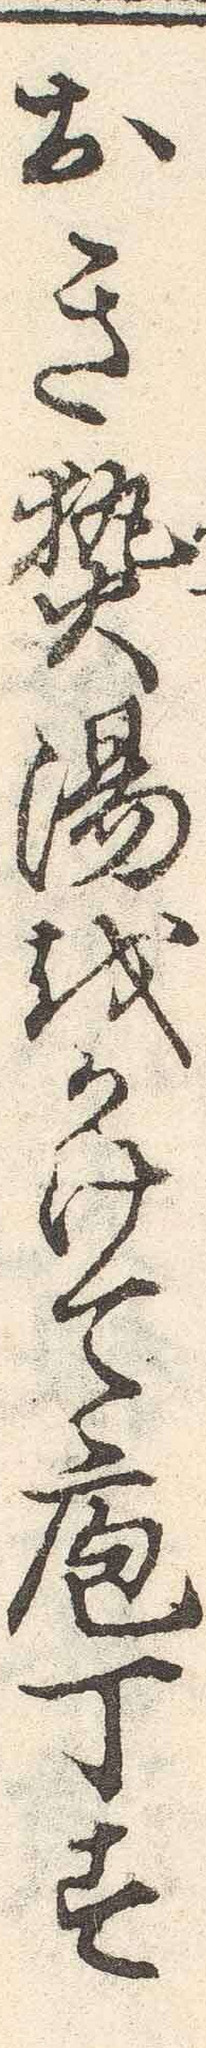おき熱湯をかけて庖丁す
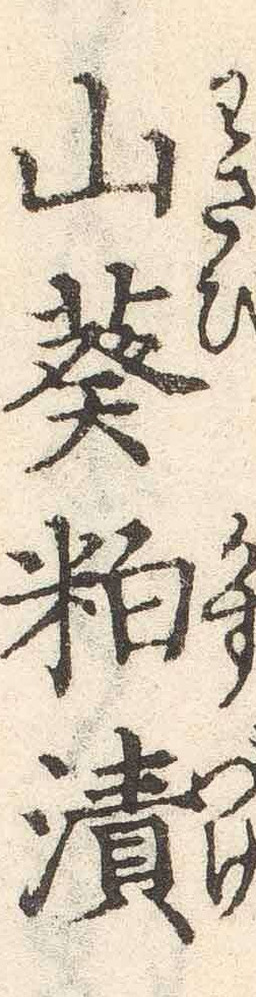山葵粕漬
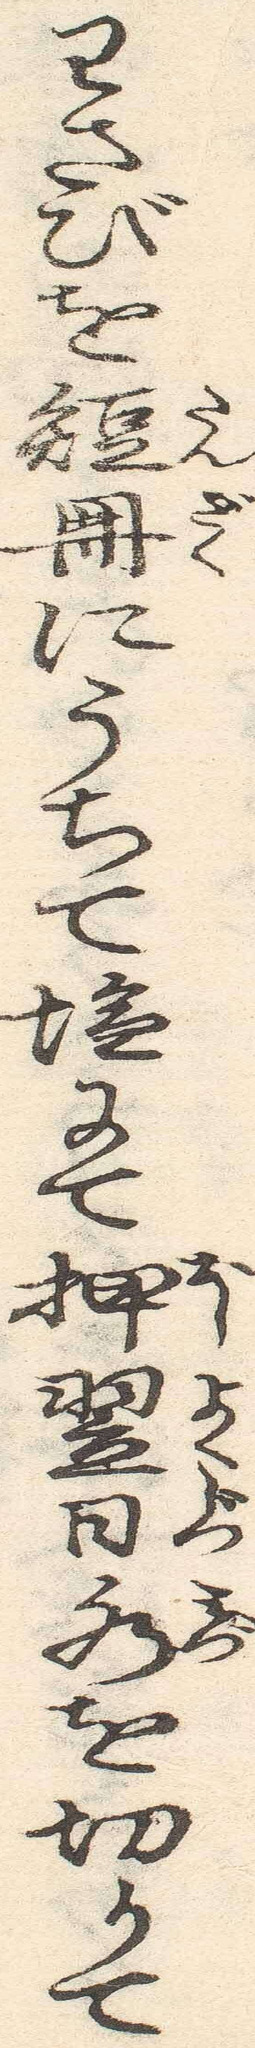わさびを短冊にうちて塩にて押翌日水を切りて
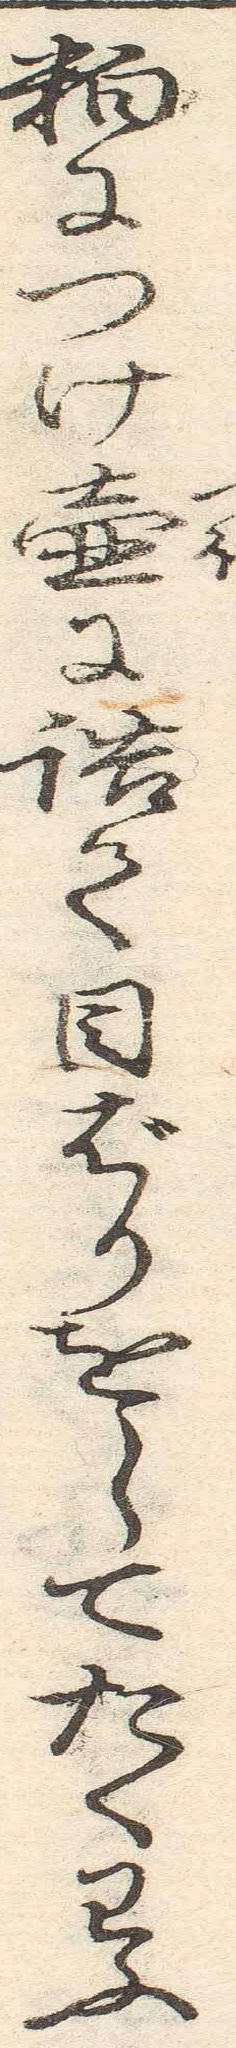粕につけ壺に詰て目ばりをしてたくわふ
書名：四季漬物塩嘉言
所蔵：東京学芸大学附属図書館 国文学研究資料館
